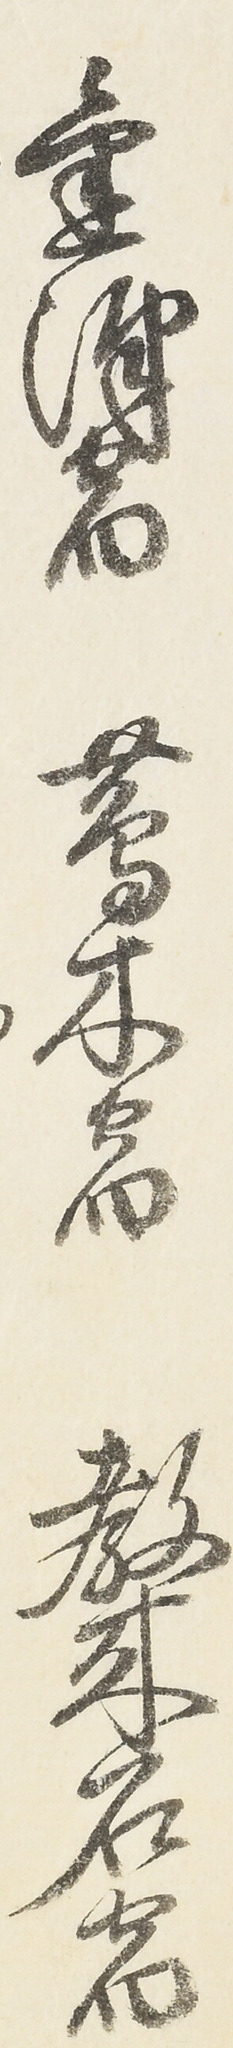金津宿蔦木宿教来石宿
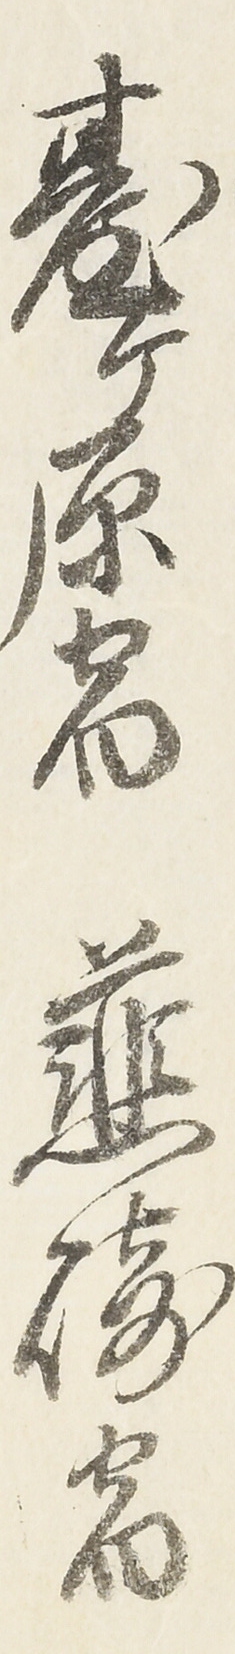台ヶ原宿韮崎宿
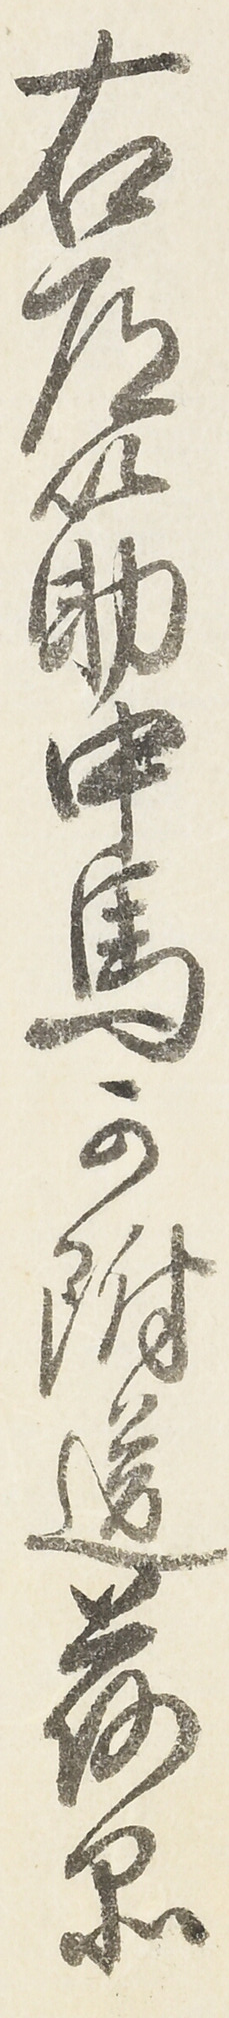右道筋中馬可附送荷品
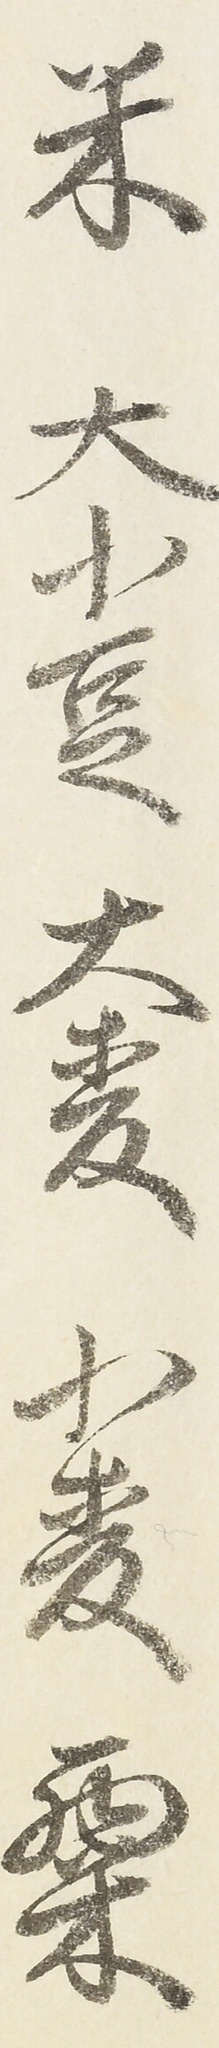米大小豆大麦小麦栗
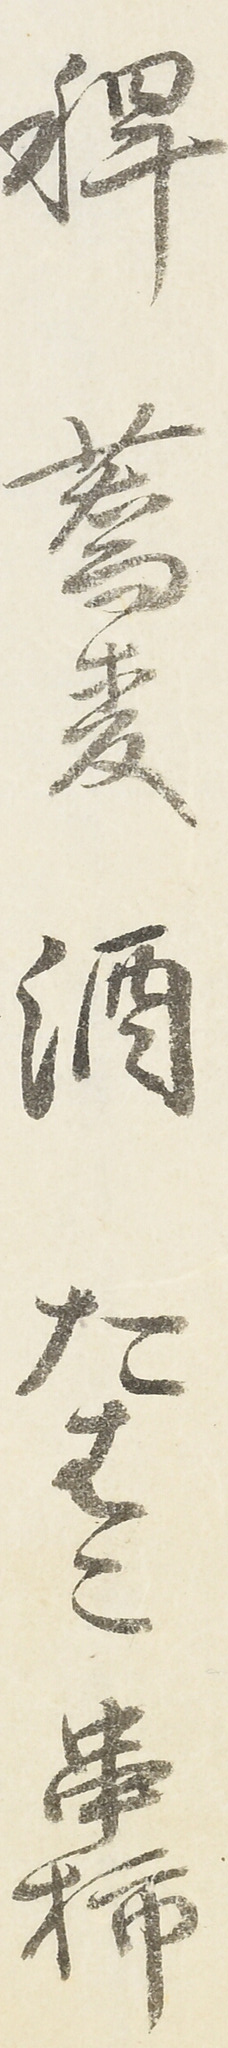稗蕎麦酒たはこ串柿
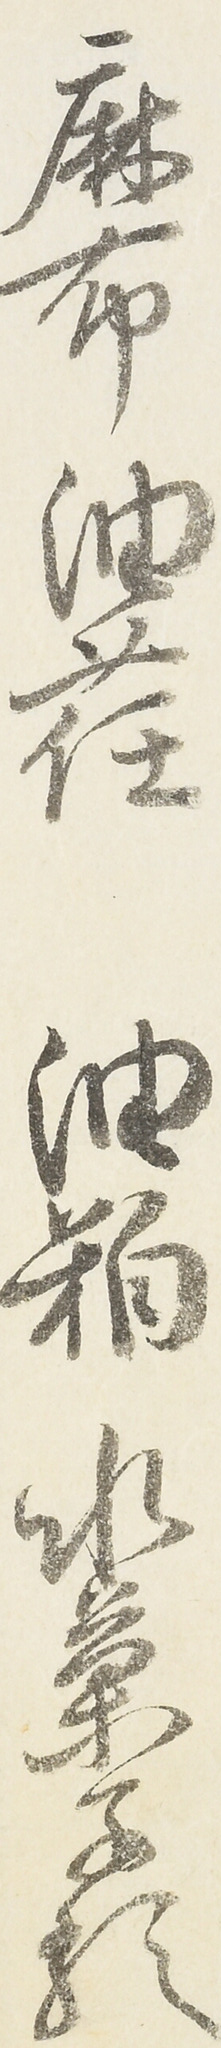麻布油荏油粕水菓子類
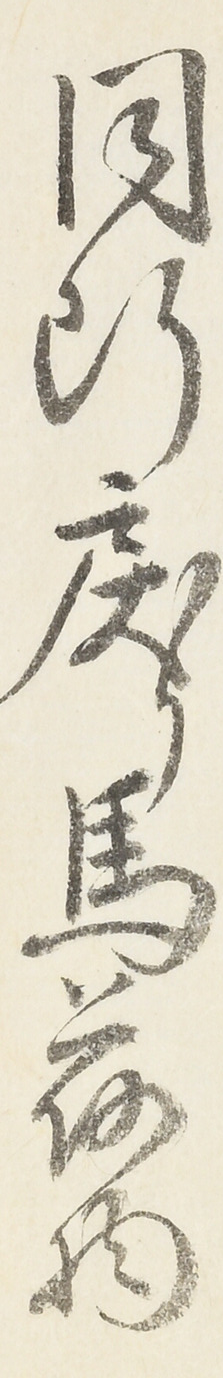同断戻り馬荷物

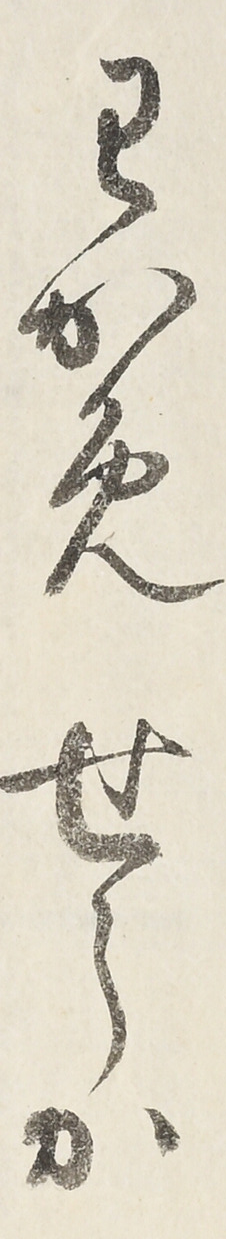わかめせうか
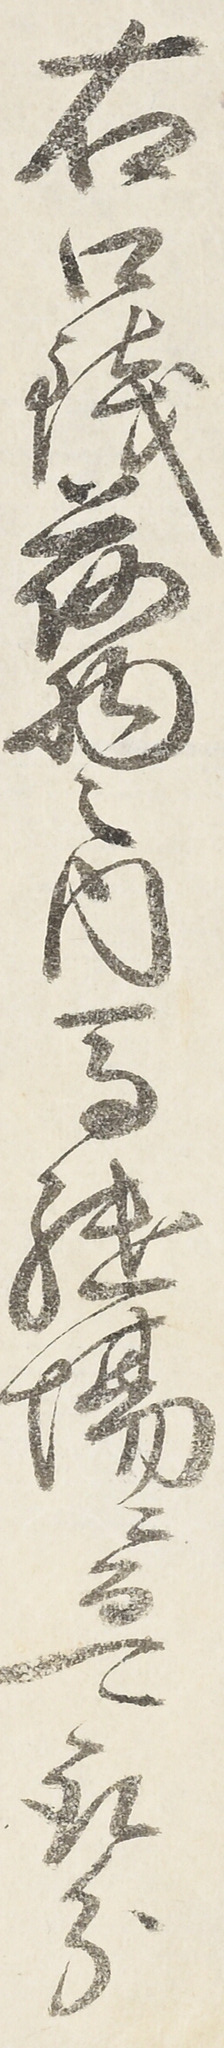右口銭荷物之内馬継場ニ而可取分
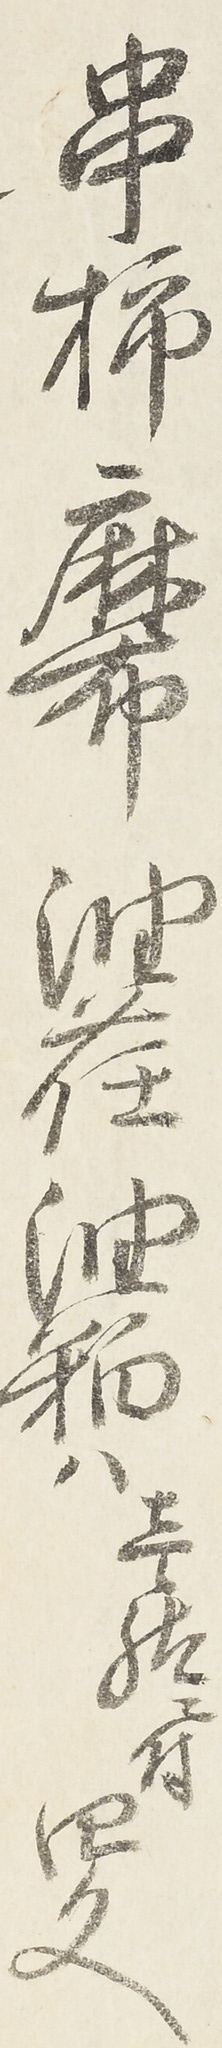串柿麻布油荏油粕ハ壱駄ニ付四文
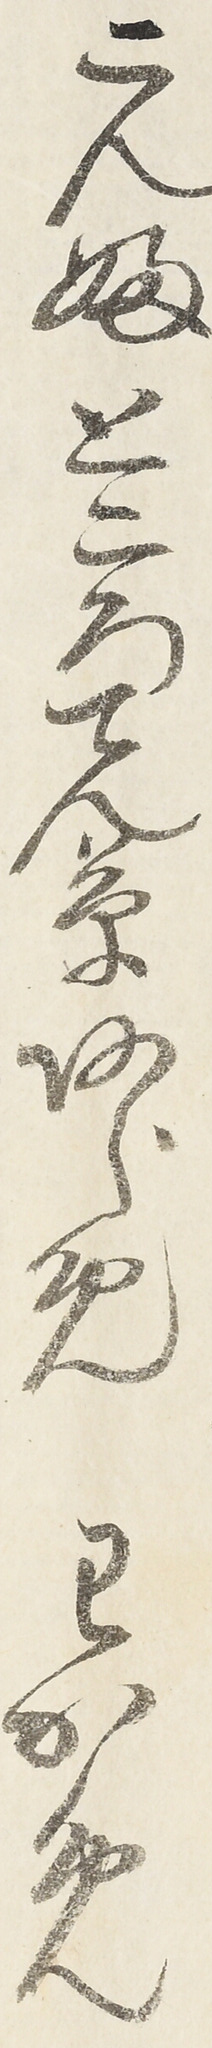こんふところてん草あらめわかめ
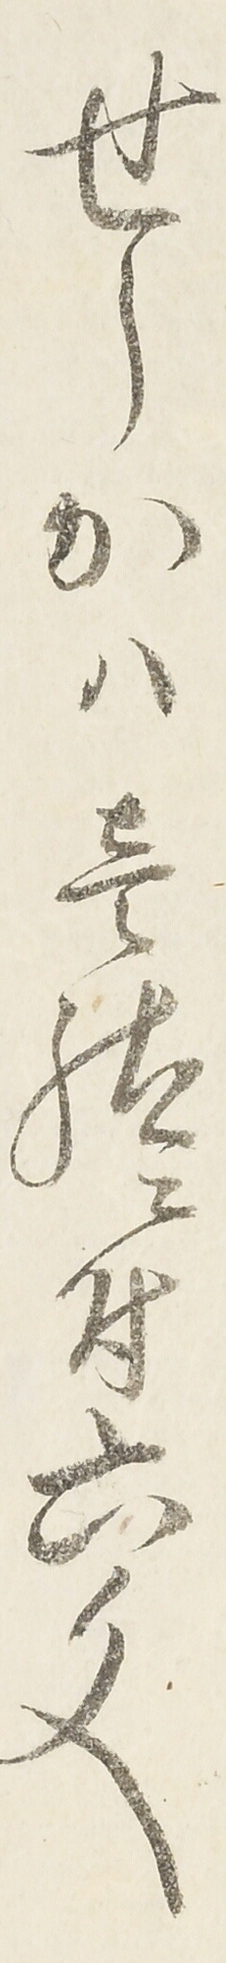せしかは壱駄ニ付六文
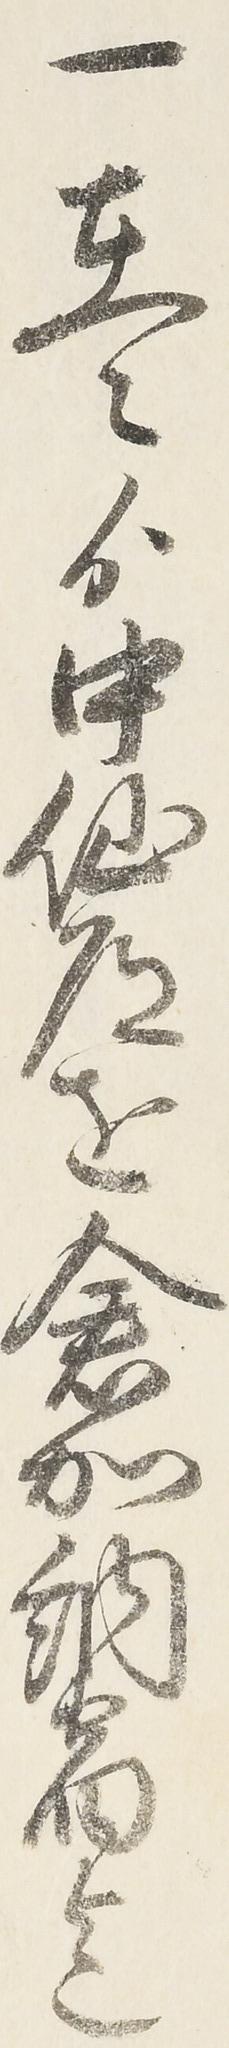一在々ゟ中仙道を倉加納宿迄
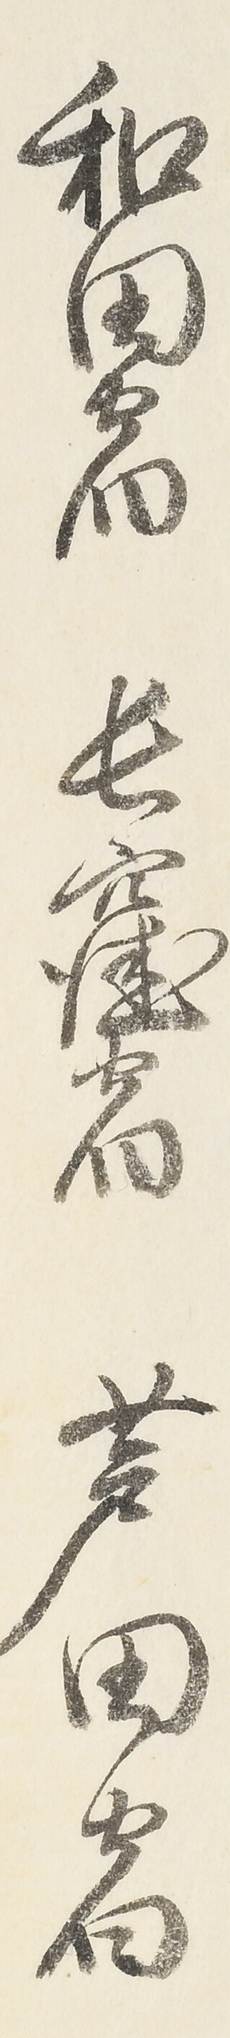和田宿長窪宿芦田宿
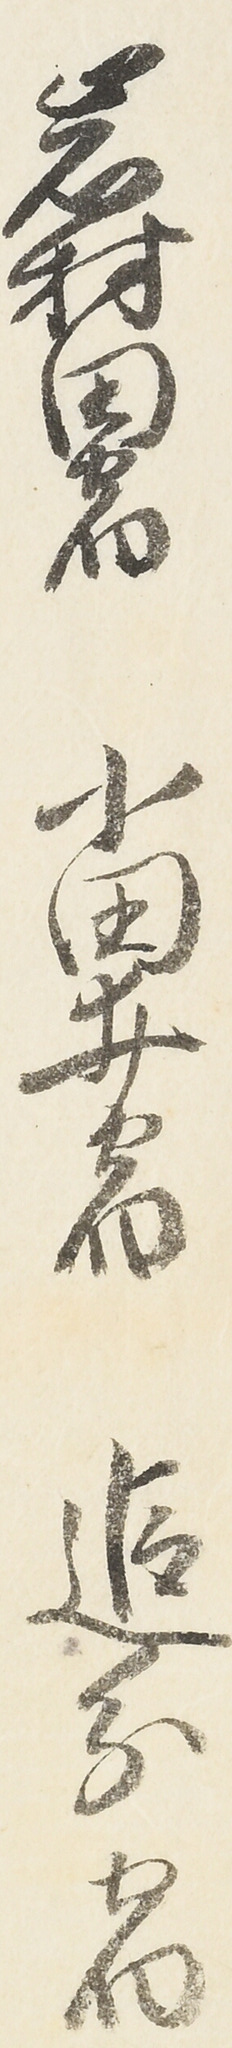岩村田宿小田井宿追分宿
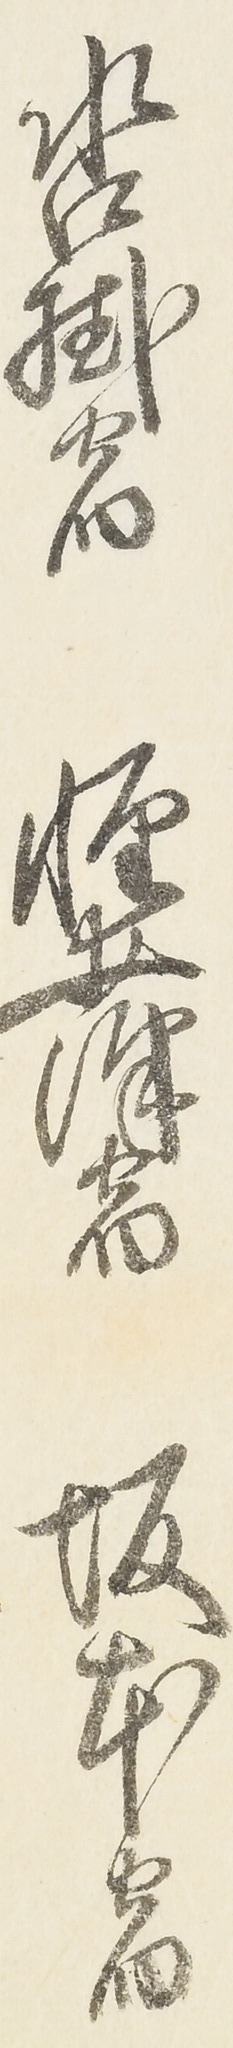沓掛宿軽井沢宿坂本宿
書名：中馬御裁許帳面
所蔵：伊那市立高遠町図書館・合同会社AMANE
